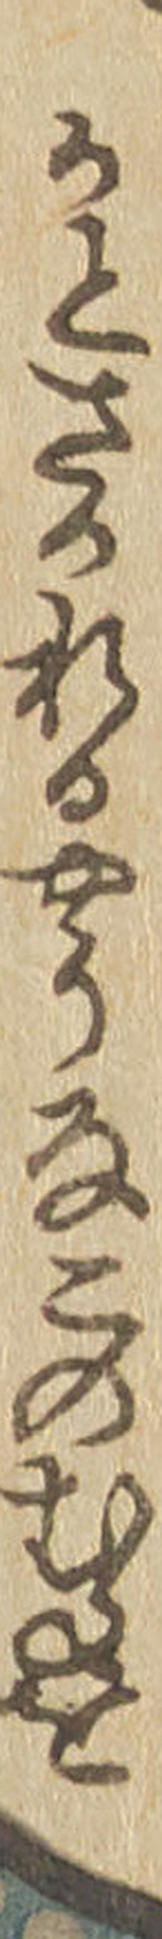かとさかれるやうなこのむねを
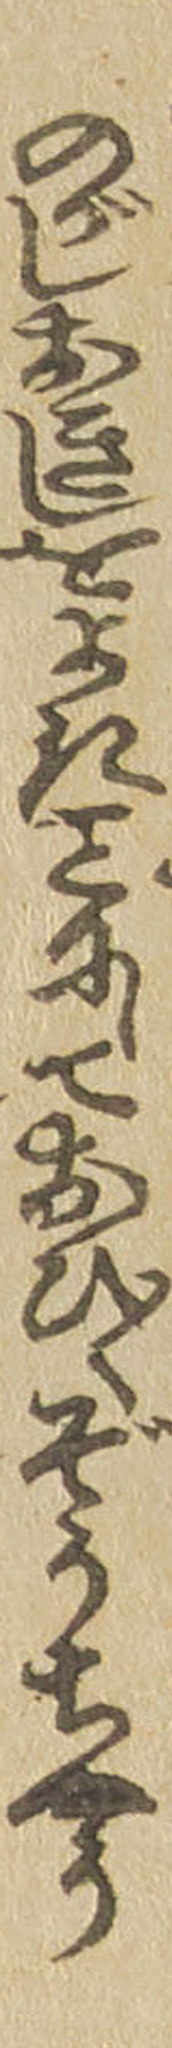のがしおきしをよきことにしておひ〳〵ぞうちやう
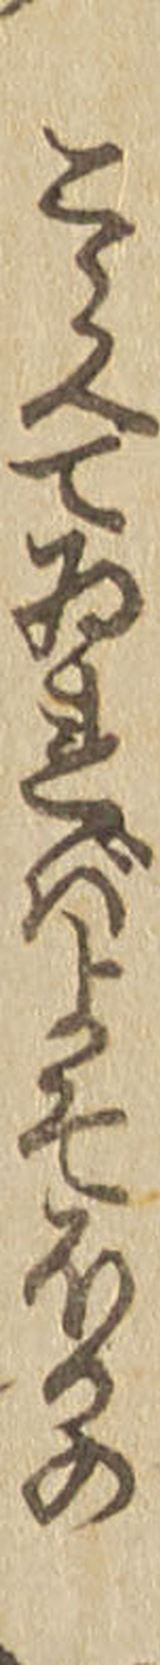こらへてゐればよそほかの
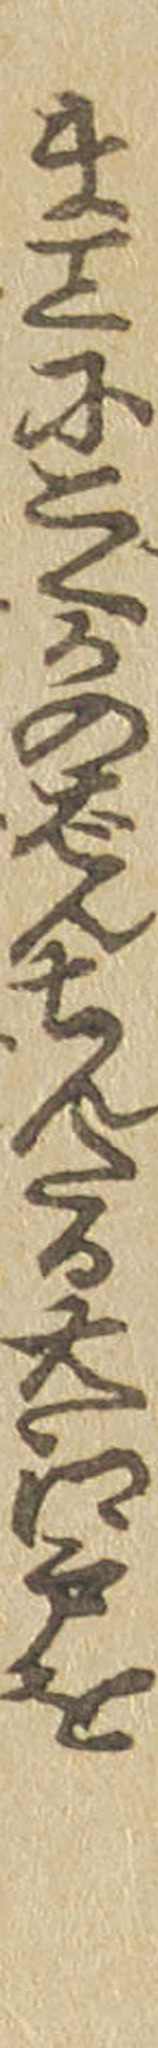まことにこくかのばんちんたる大江戸を
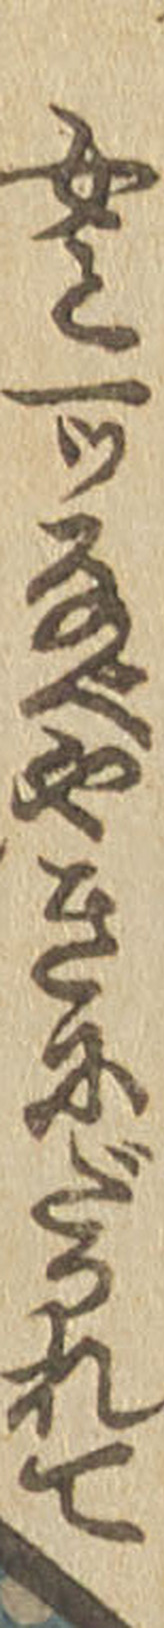女と一つなべやきにだかれて
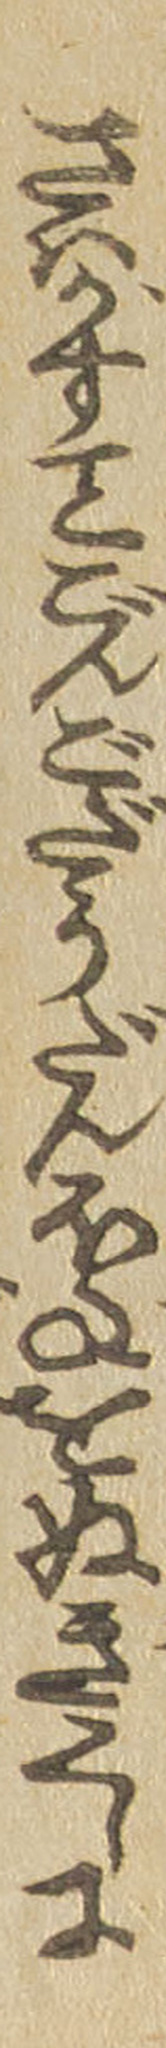さはがすことごんごだうだんほねをぬきくしに
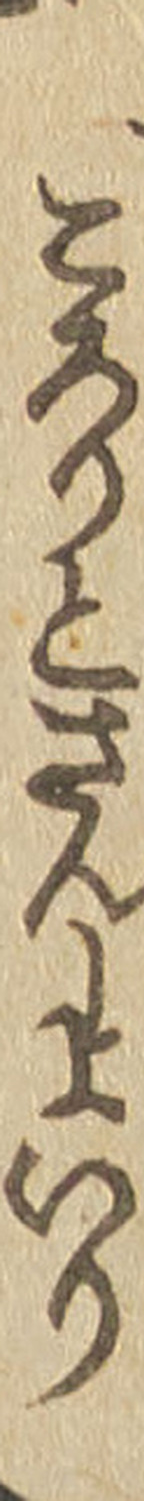ころりとさんしよいり
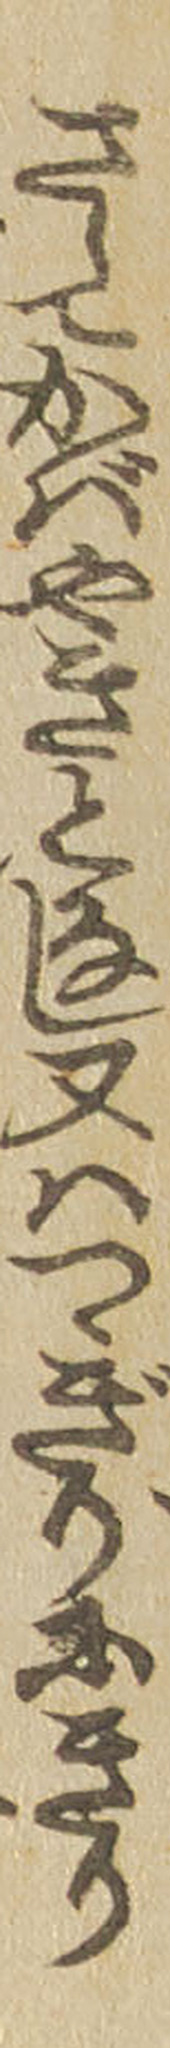さしてかばやきとなし又はつゝぎりにきり
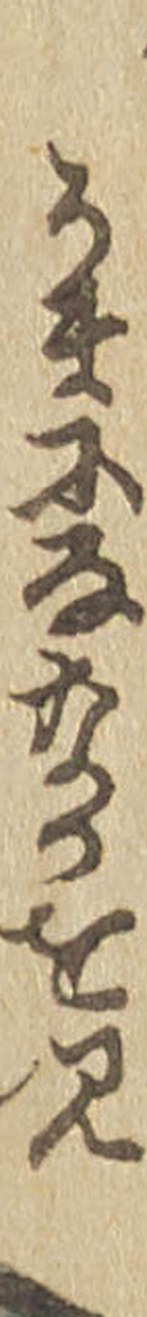うまにななかを見
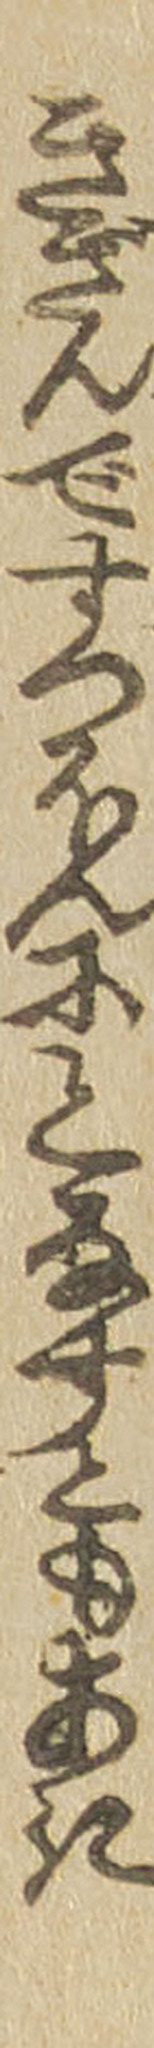きざんですつほんにとなすともあき
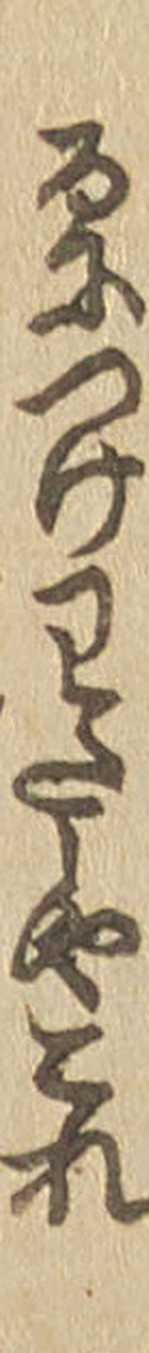るにつけわたしやこれ
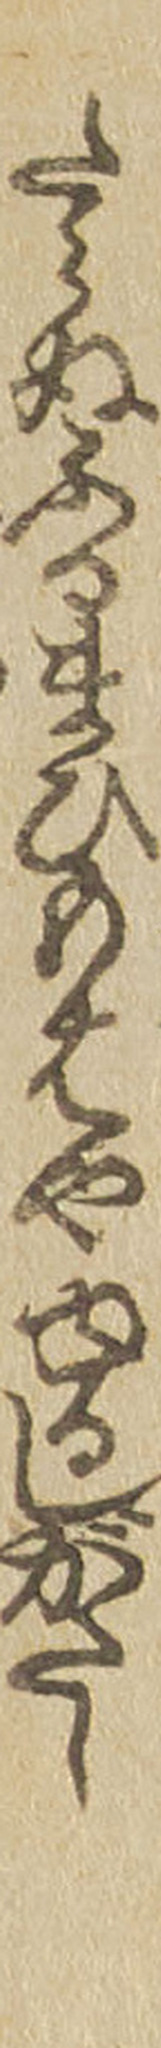たらぬふるまいもはやゆるしがたし
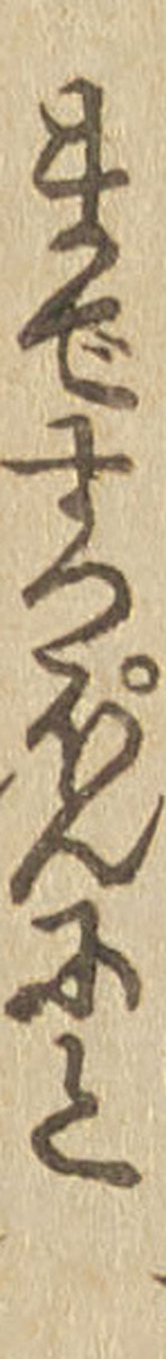まですつぽんにと
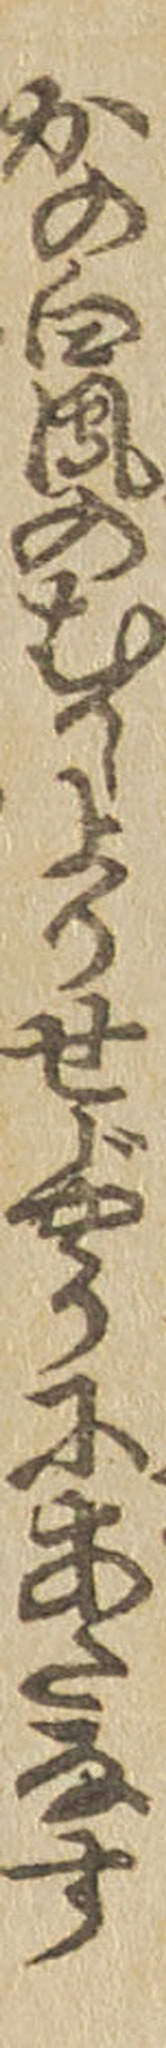かの白鳳のむかしよりせじやうにあたなす
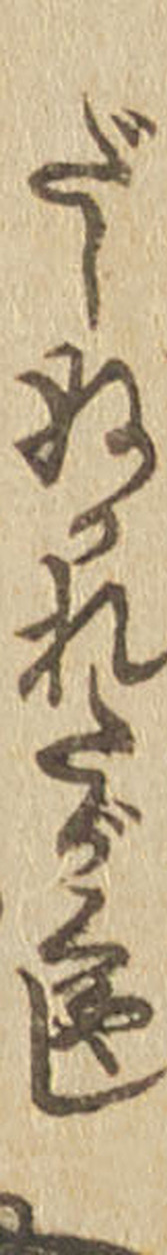だしぬかれたがくやし
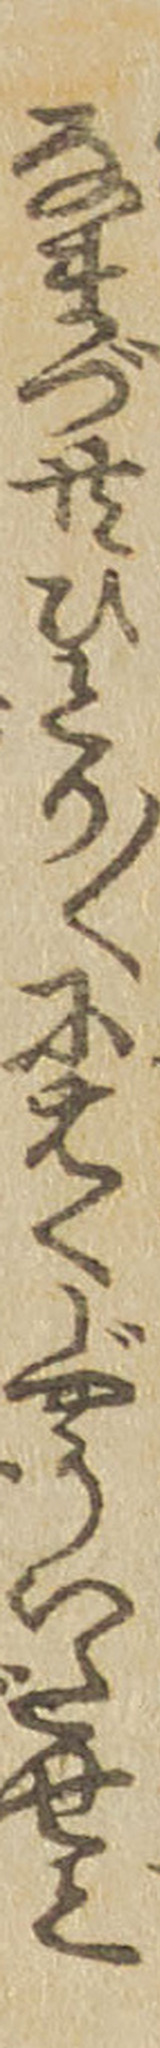なまづ共ひとり〳〵にはくじやういたせと
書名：地震太平記
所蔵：東京大学総合図書館 General Library in the University of Tokyo, JAPAN
